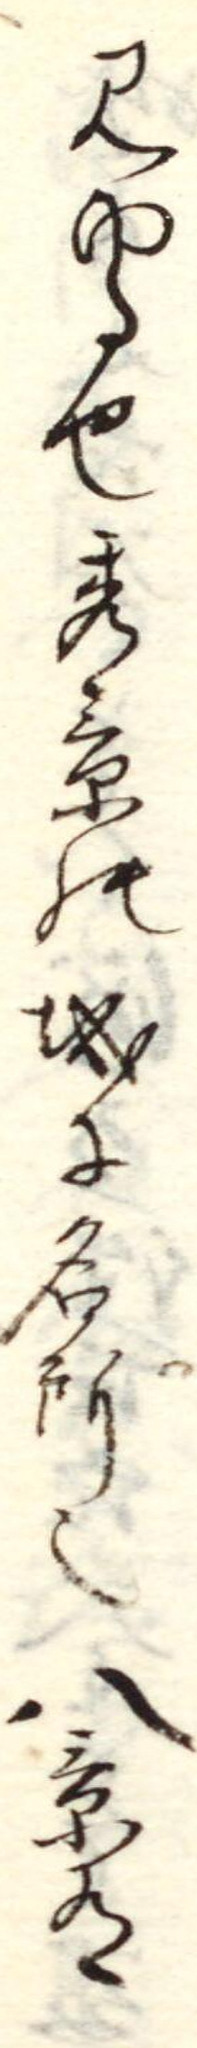見ゆる也秀景の誠に名所也八景有
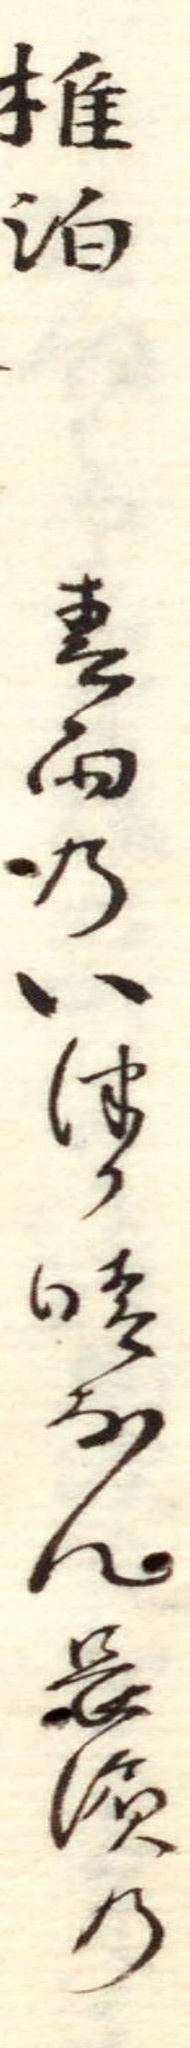椎泊春雨のいつか晴なん長浜の
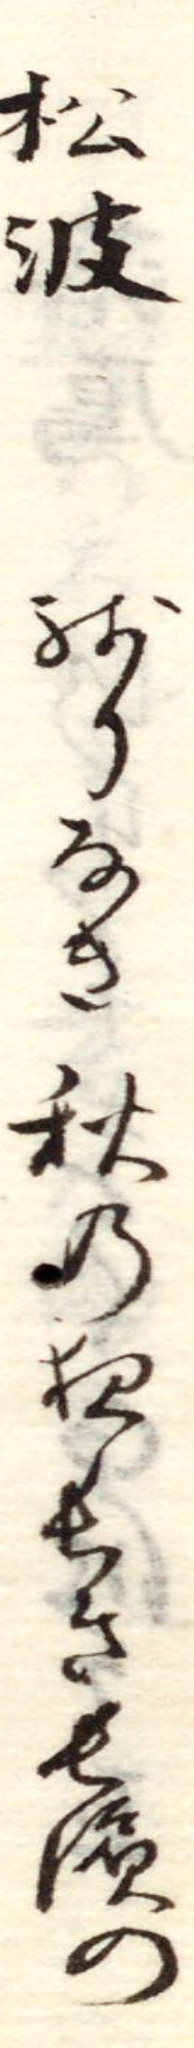松波残りなき秋の夜長き長浜の
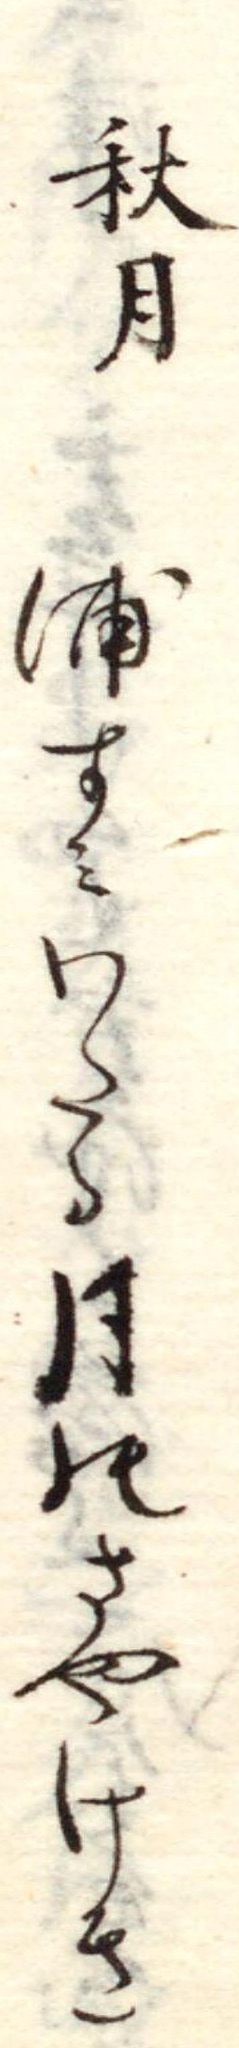秋月浦すみわたる月のさやけき
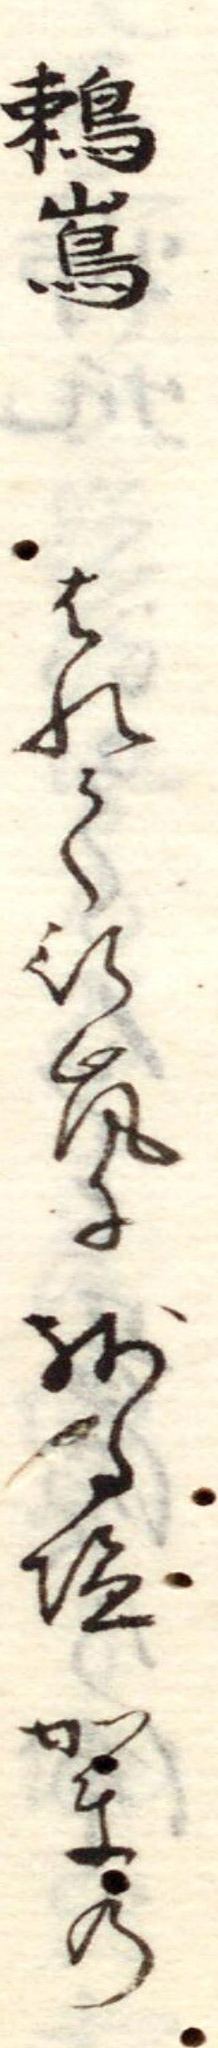鵜嶌はれて行嵐に残る塩かまの
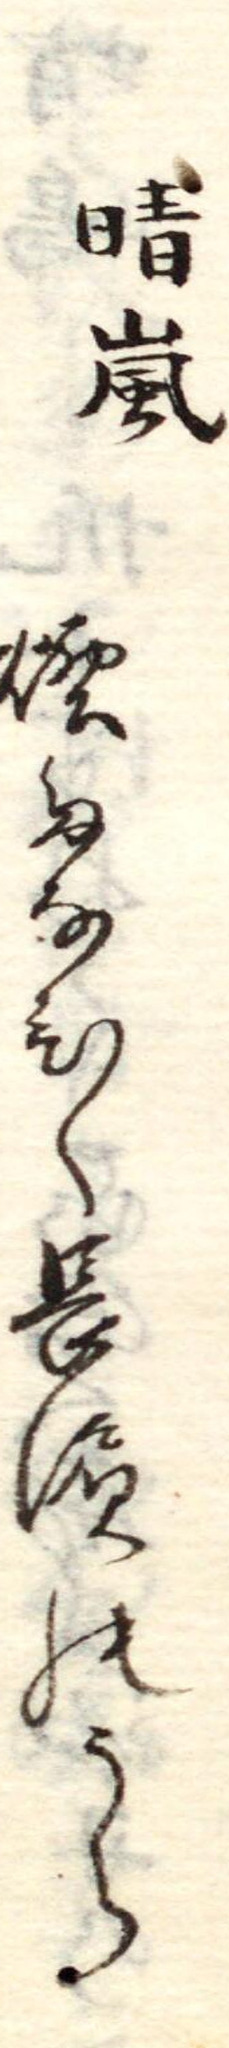晴嵐煙たなひく長浜のうら
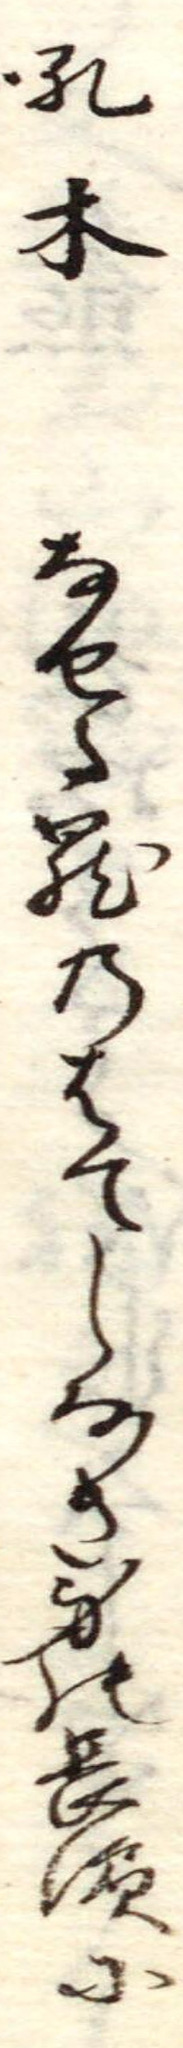吼木なせる蔵のはてしなき身の長浜に
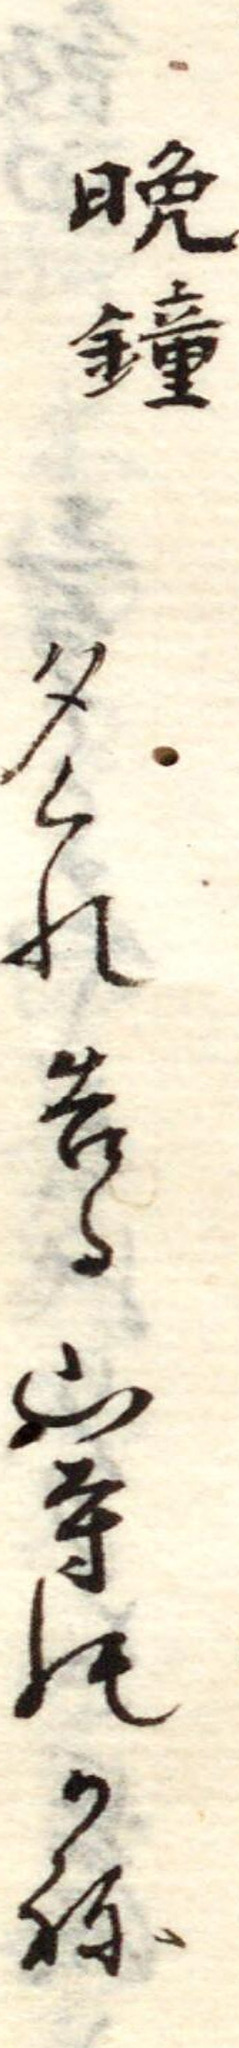晩鐘夕くれ告る山寺のかね
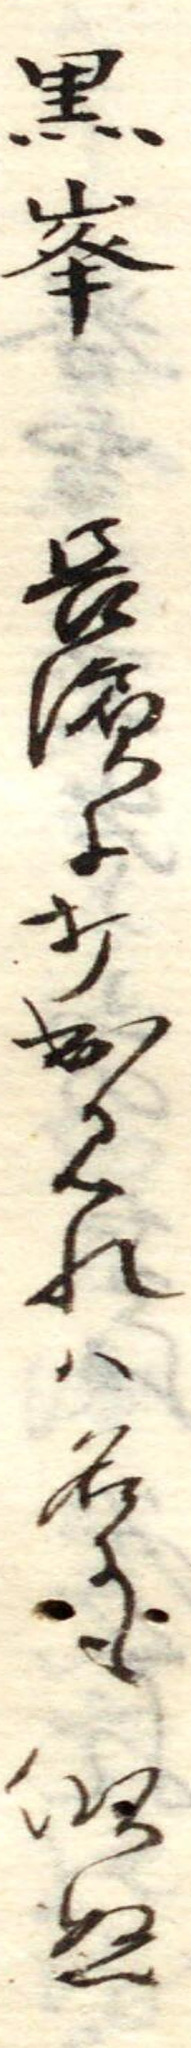黒峯長浜に打出見れは名にも似ぬ

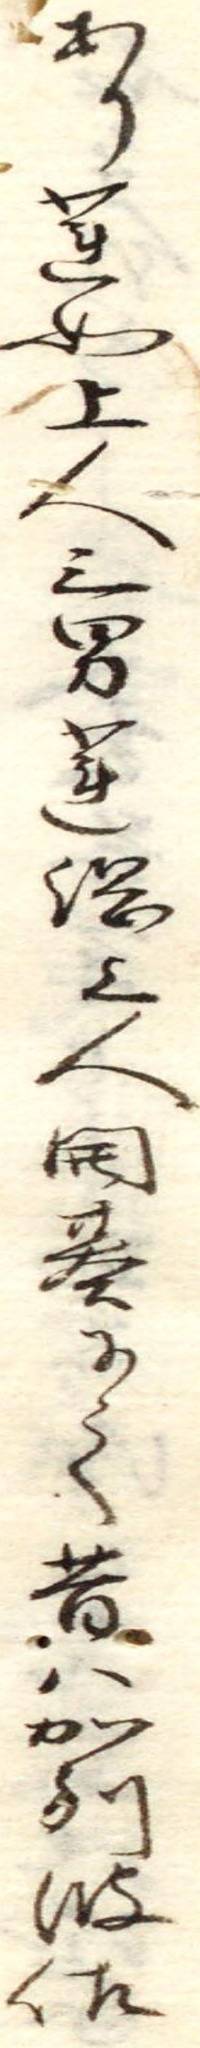あり蓮如上人三男連綱上人開基にて昔は加州波佐
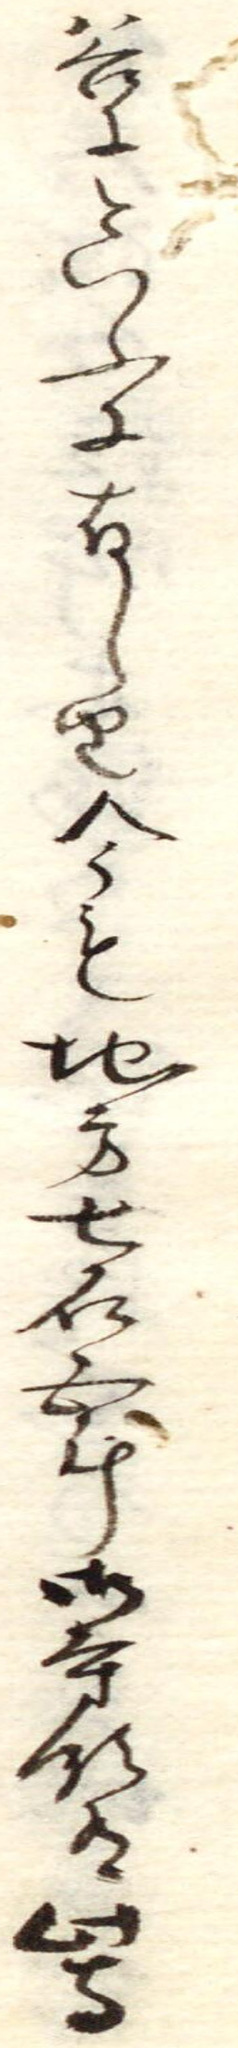谷にといふに有し由也今も地方七石五斗御寺領有此寺
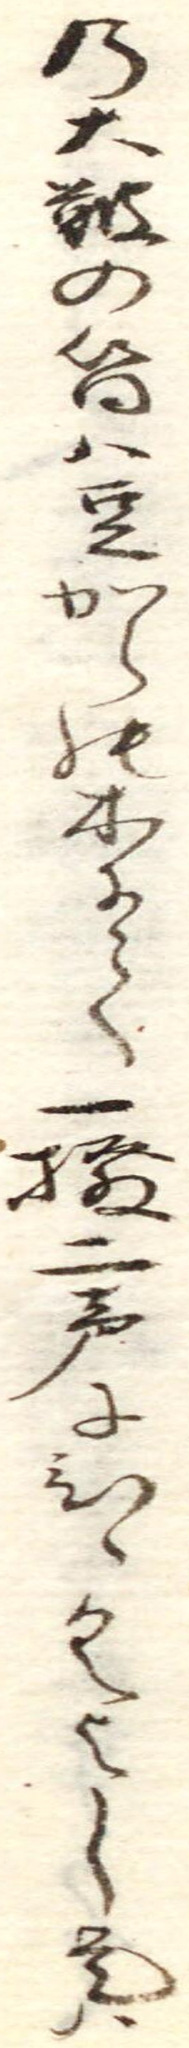の太鼓の筒は豆からの木にて一撥二声にひゝくよし是は
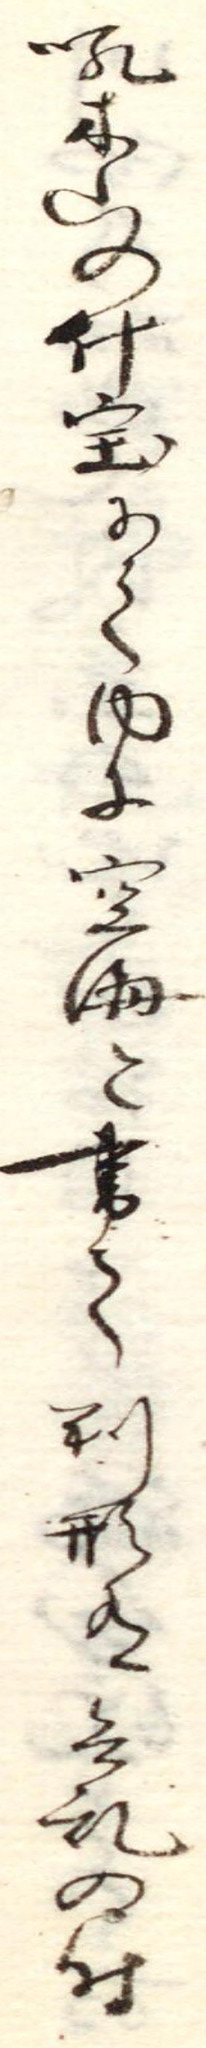吼木山の什宝にて内に空海と書て判形有兵乱の時
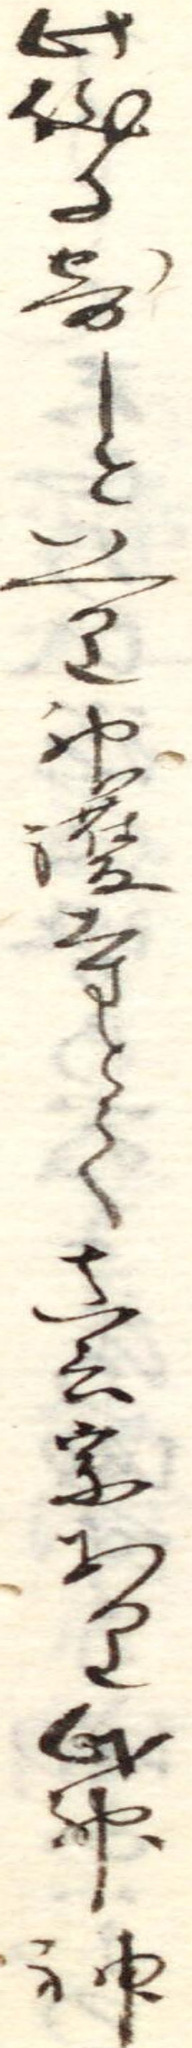此磯に寄しといへり神護寺とて真言宗あり氏神神
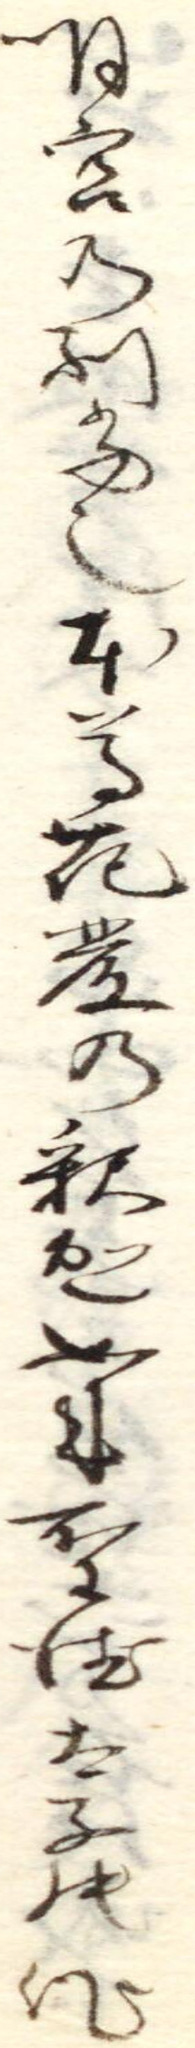明宮の別当也本尊花厳の釈迦如来聖徳太子の作
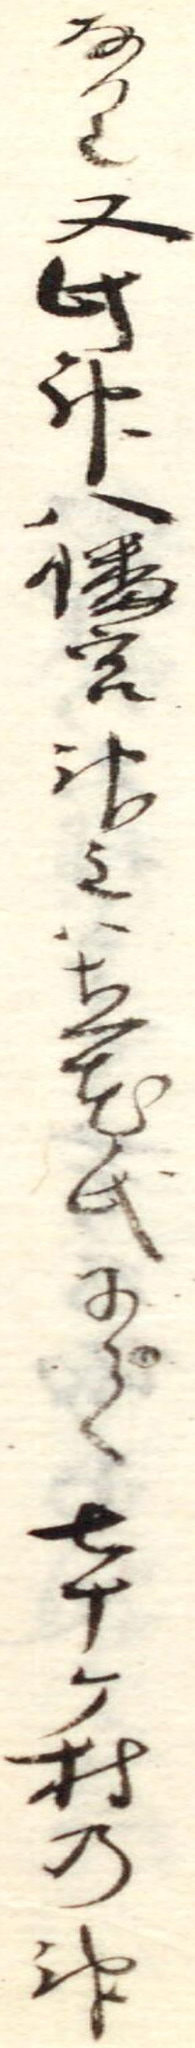なり也又此神八幡宮神主は立花氏にて七十ヶ村の神
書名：能登名跡誌
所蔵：Ishikawa Prefectural Library
